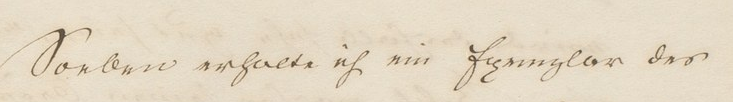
Soeben erhalte ich ein Exemplar des
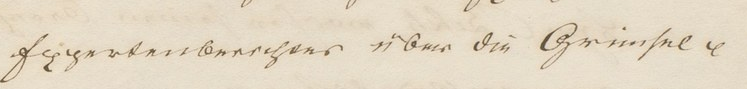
Expertenberichtes über die Grimsel &
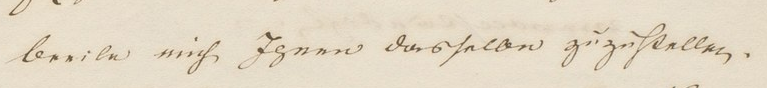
beeile mich Ihnen dasselbe zuzustellen.
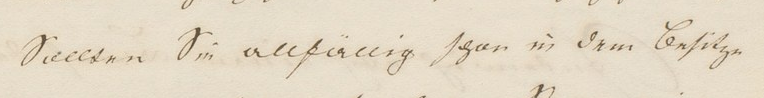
Sollten Sie allfällig schon in dem Besitze
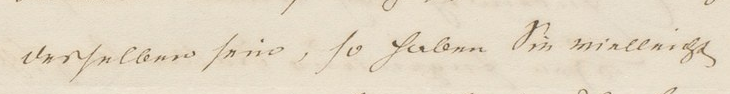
desselben sein, so haben Sie vielleicht
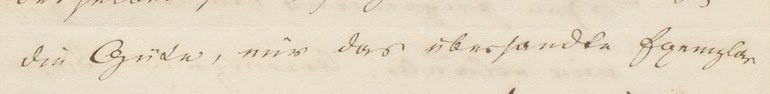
die Güte, mir das übersandte Exemplar
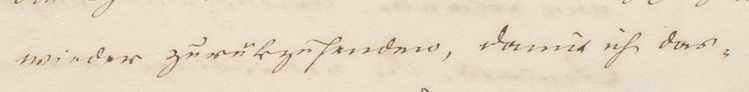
wieder zurükzusenden, damit ich das-
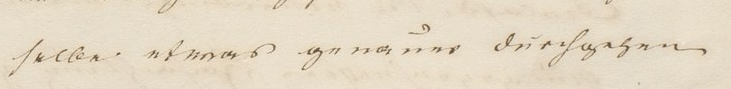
selbe etwas genauer durchgehen
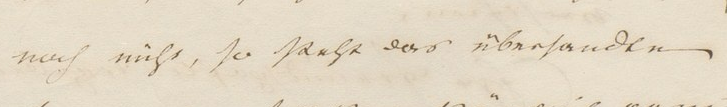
noch nicht, so steht das übersandte
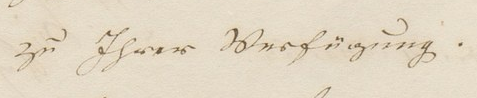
zu Ihrer Verfügung. –
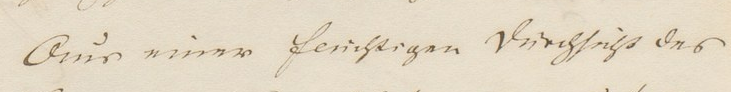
Aus einer flüchtigen Durchsicht des
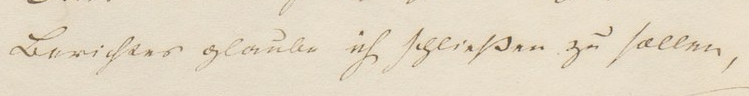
Berichtes glaube ich schließen zu sollen,
